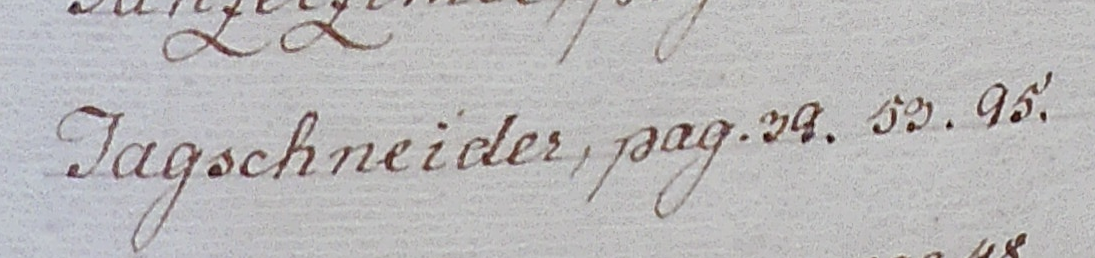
Tagschneider, pag. 39. 53. 95.
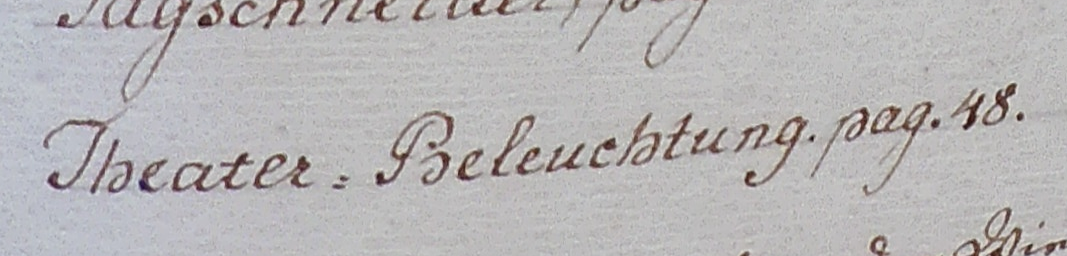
Theater=Beleuchtung. pag. 48.
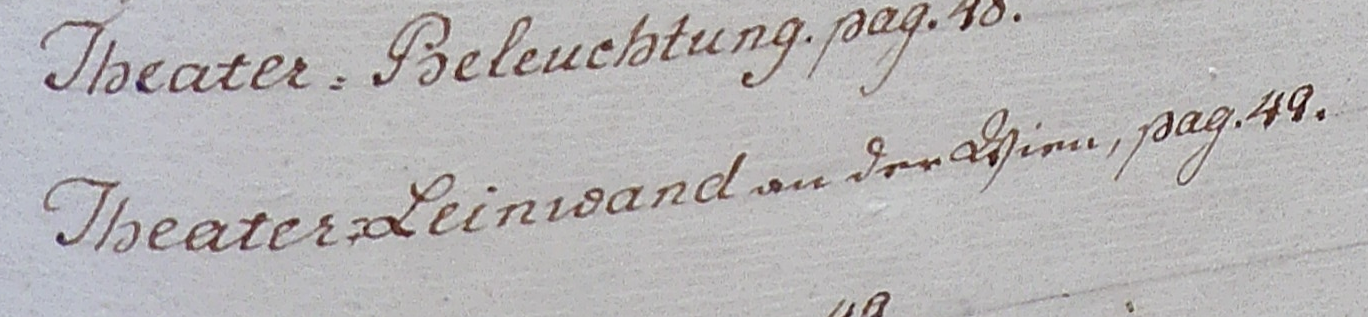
Theater=Leinwand an der Wien, pag. 49.
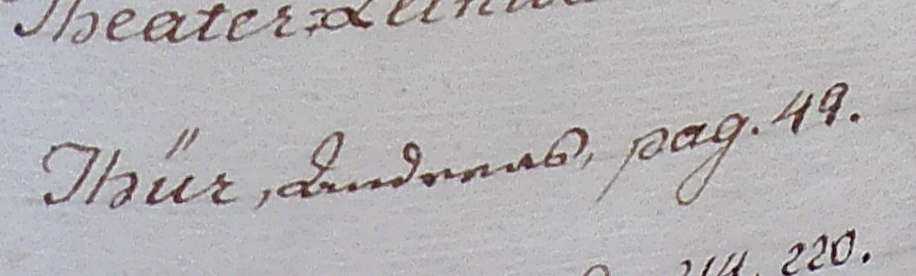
Thür, Andreas, pag. 49.
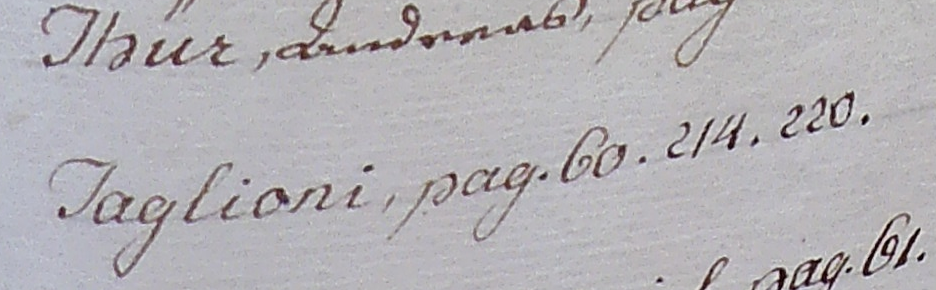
Taglioni, pag. 60. 214. 220.
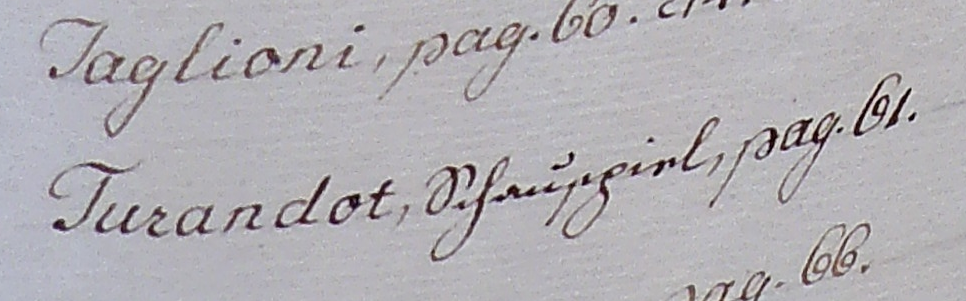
Turandot, Schauspiel, pag. 61.
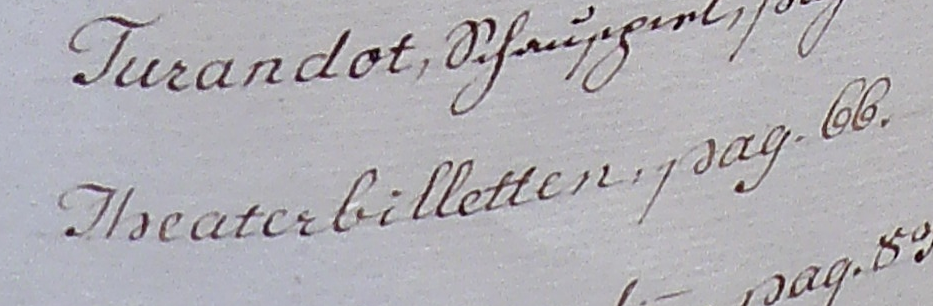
Theaterbilletten, pag. 66.
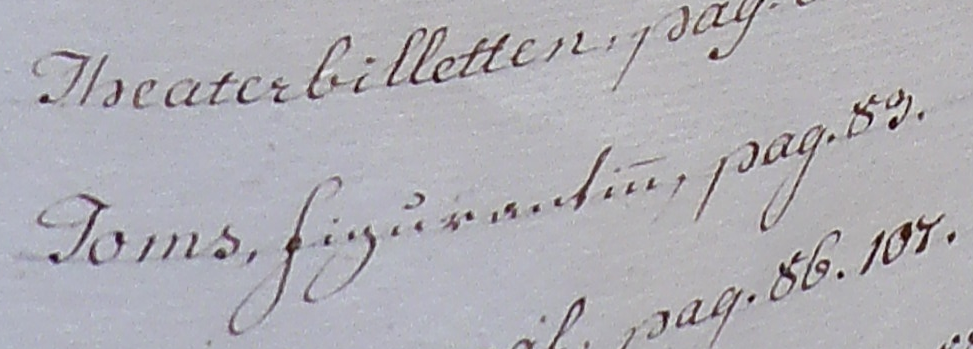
Toms, Figurantin̅, pag. 83.
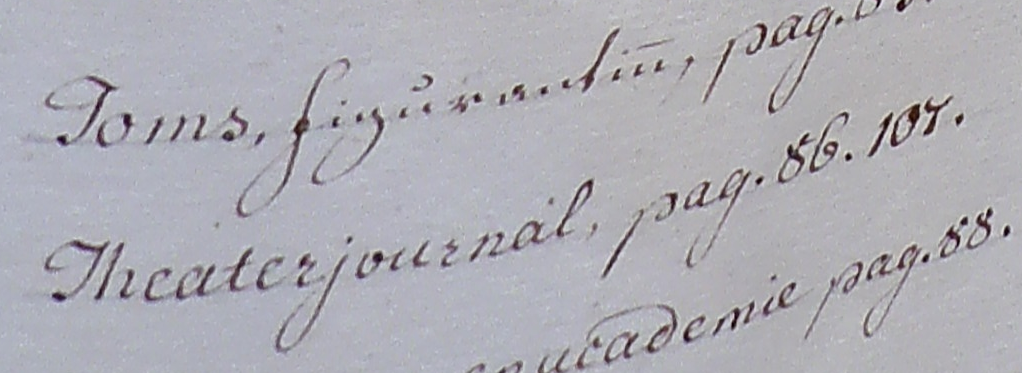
Theaterjournal, pag. 86. 107.
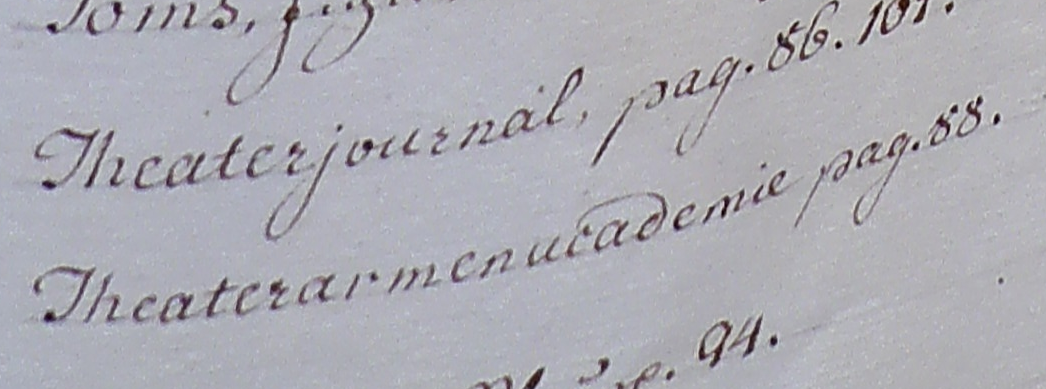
Theaterarmenacademie pag. 88.
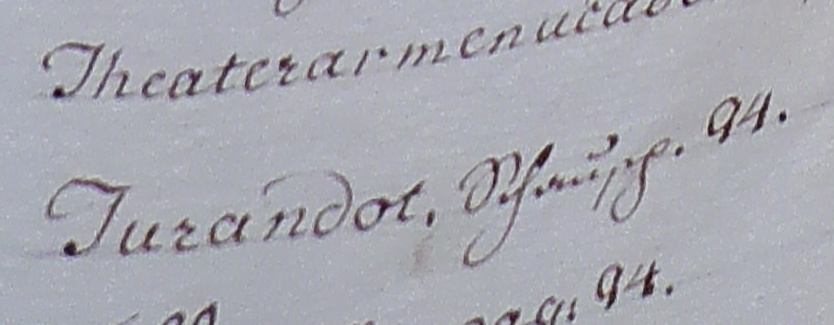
Turandot, Schausp. 94.
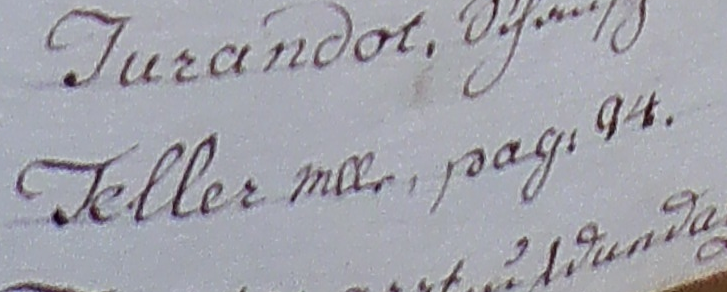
Teller Mlle, pag: 94.
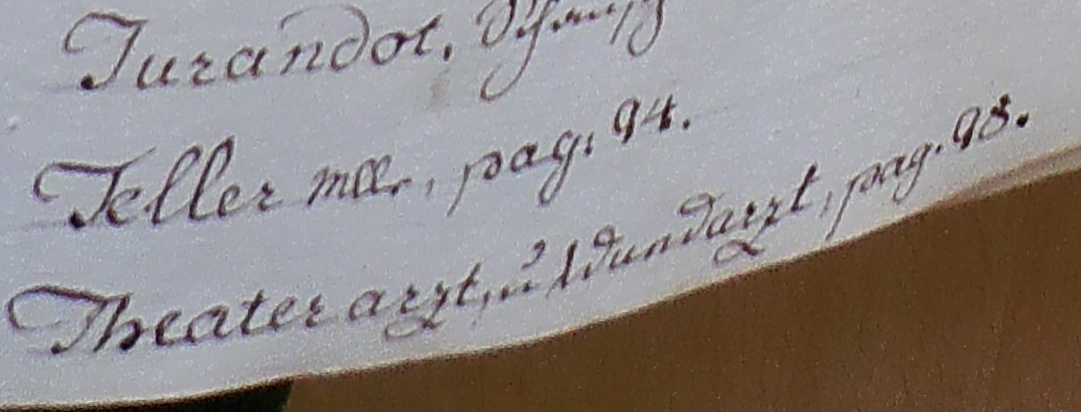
Theaterarzt, u Wundarzt, pag. 98.
